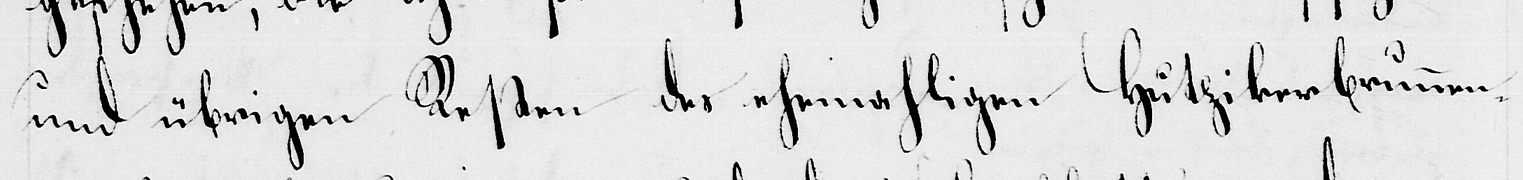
und übrigen Resten des ehemahligen Hutzikerbrunnen¬
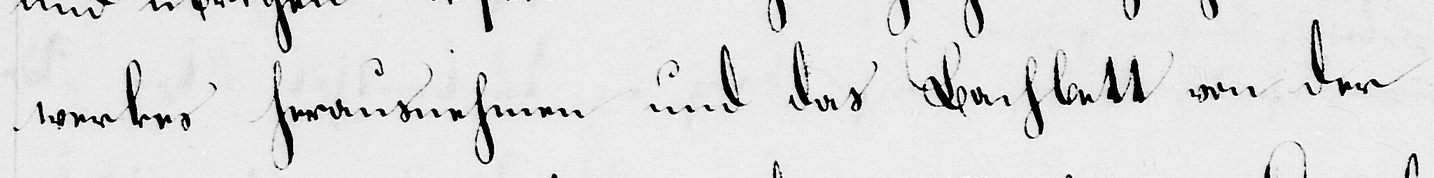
werkes herausnehmen und das Bachbett von der
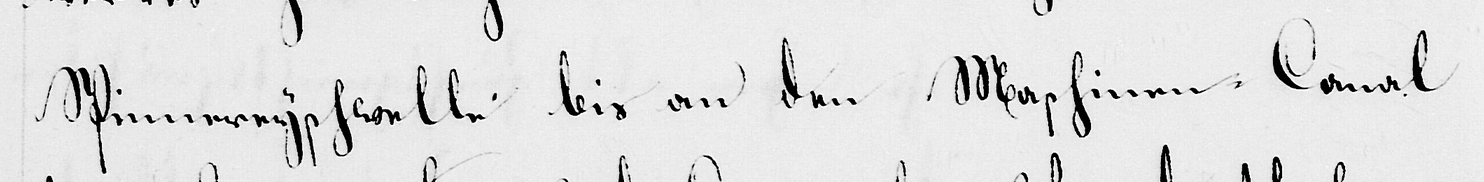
Spinnereyschwelle bis an den Maschinen-Canal
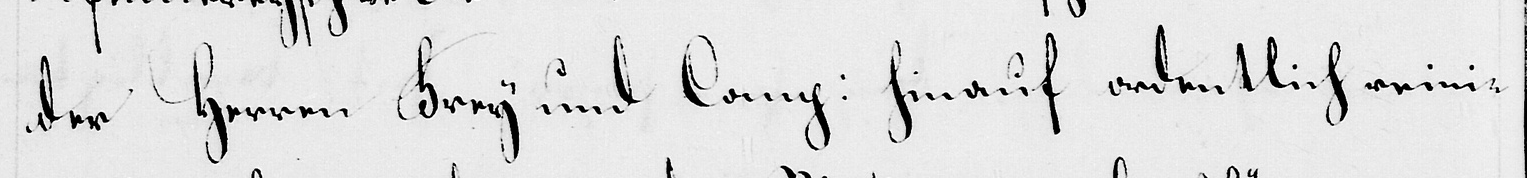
der Herren Frey und Comp: hinauf ordentlich reini¬
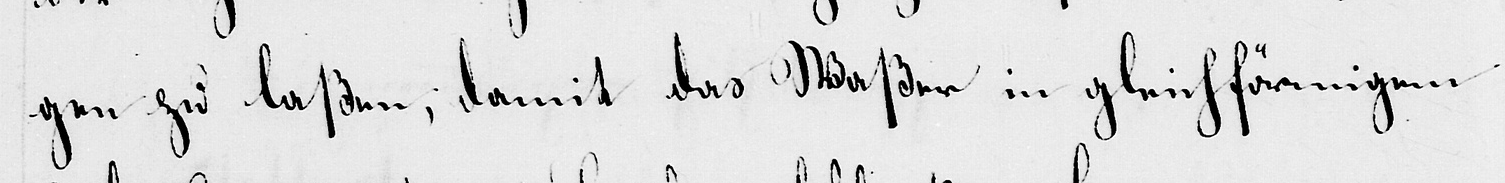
gen zu laßen, damit das Waßer in gleichförmigem
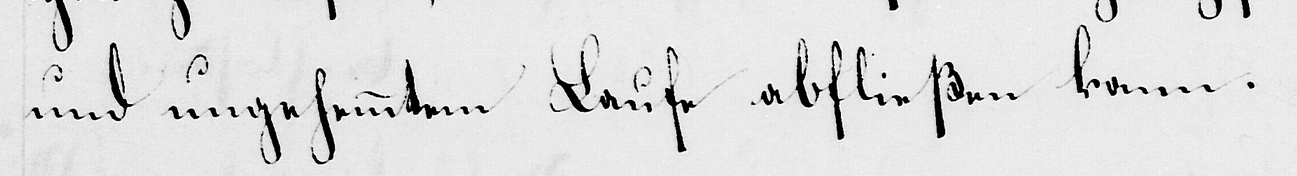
und ungehemmtem Laufe abfließen kann.
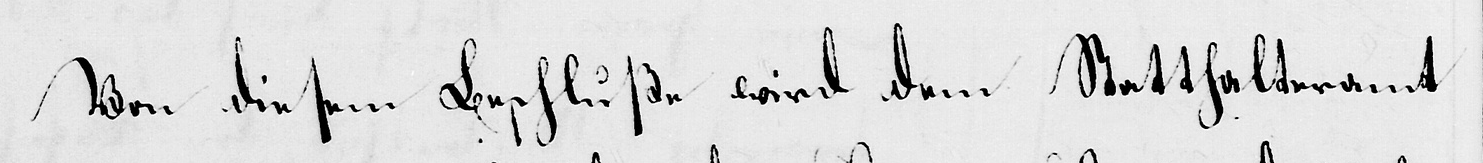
Von diesem Beschluße wird dem Statthalteramt
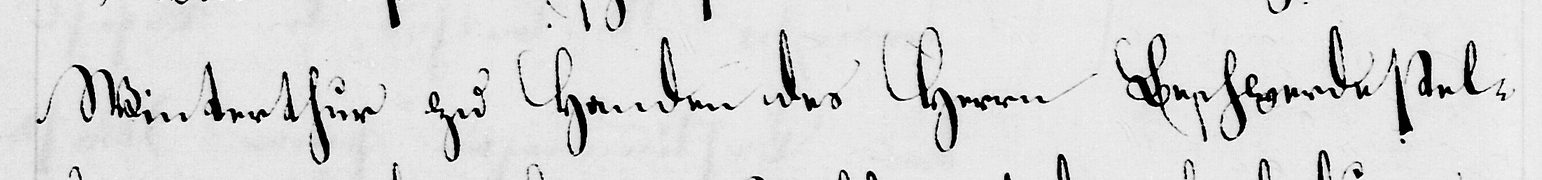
Winterthur zu Handen des Herrn Beschwerdestel¬
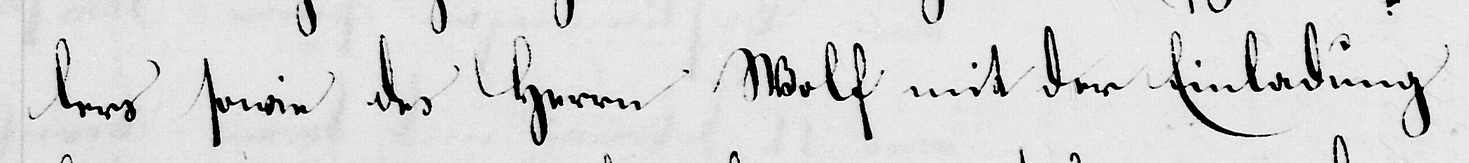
lers sowie des Herrn Wolf mit der Einladung
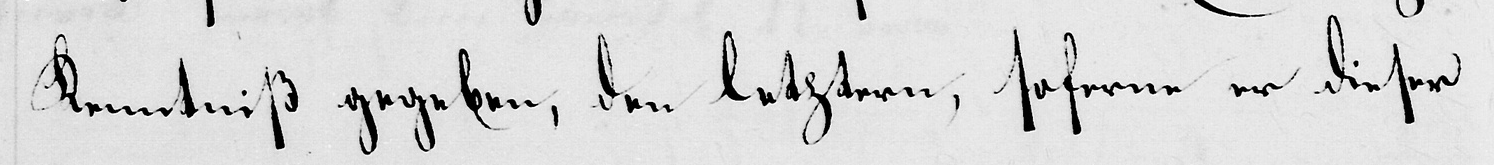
Kenntniß gegeben, den letzern, soferne er dieser
